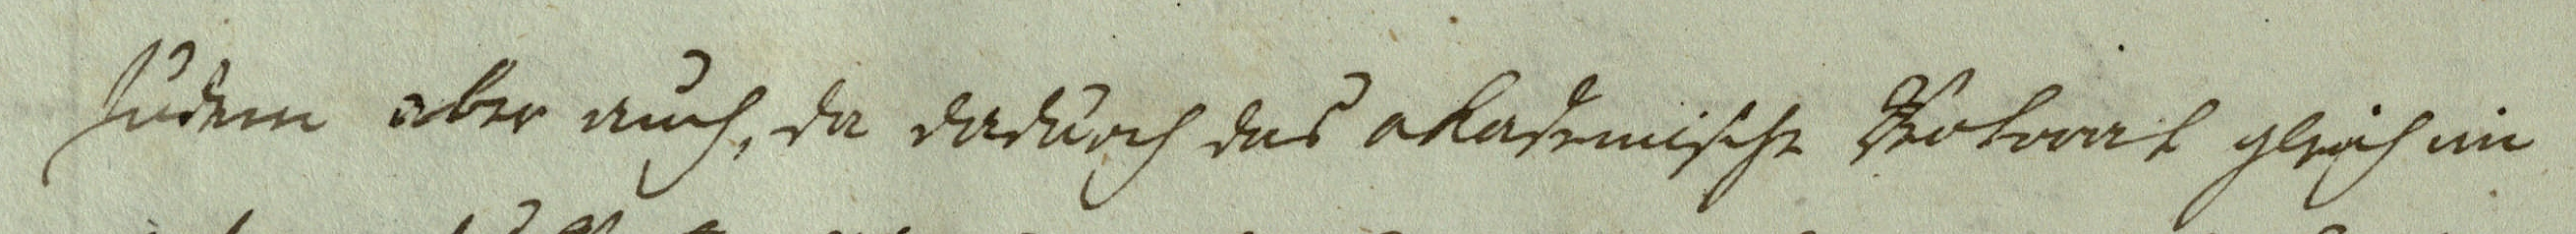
zudem aber auch, da dadurch das akademische Rectorat gleich im
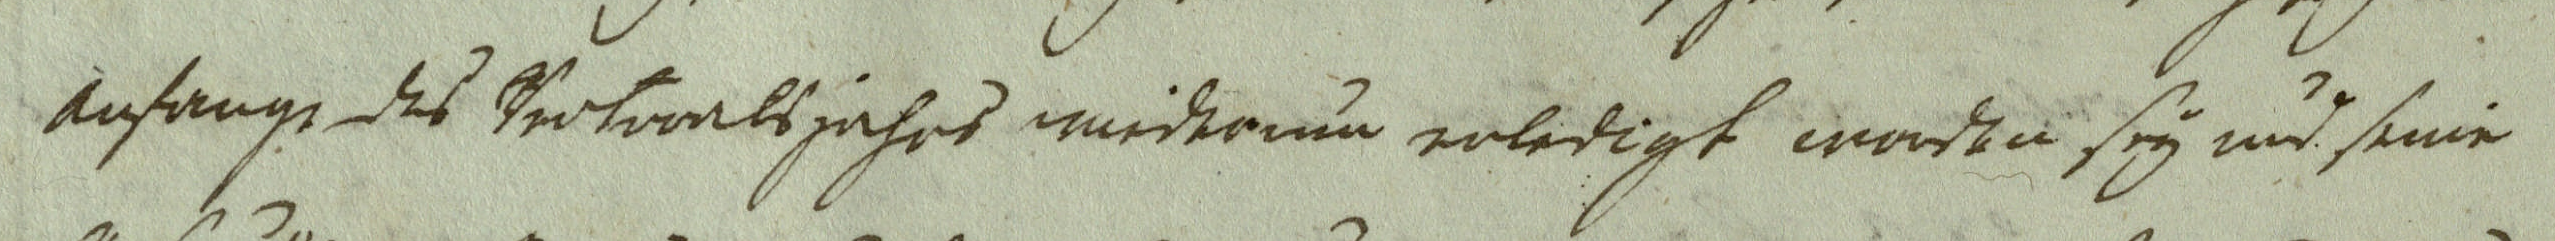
Anfange des Rectoratsjahrs wiederum erledigt worden seÿ und seine
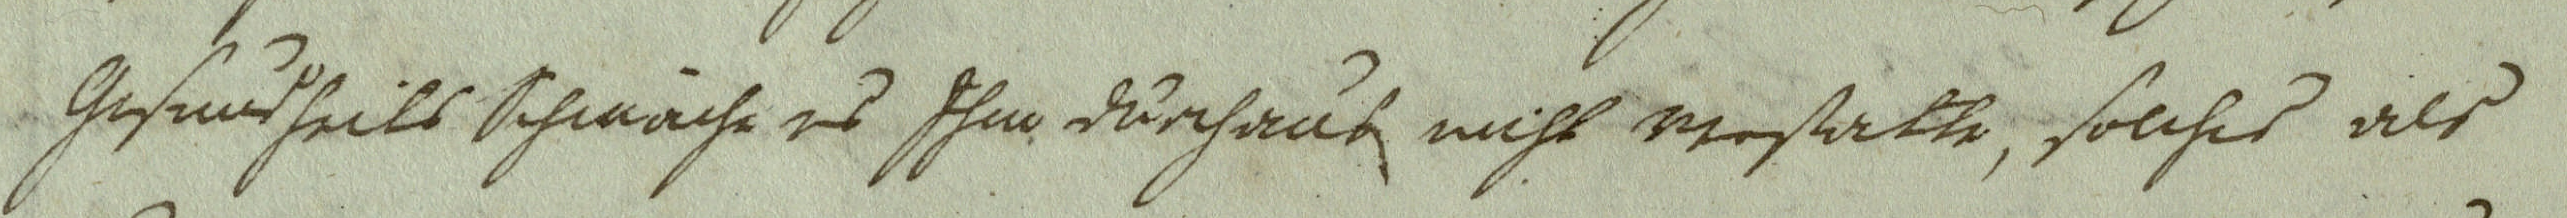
Gesundheits Schwäche es Ihm durchaus nicht verstatte, solches als
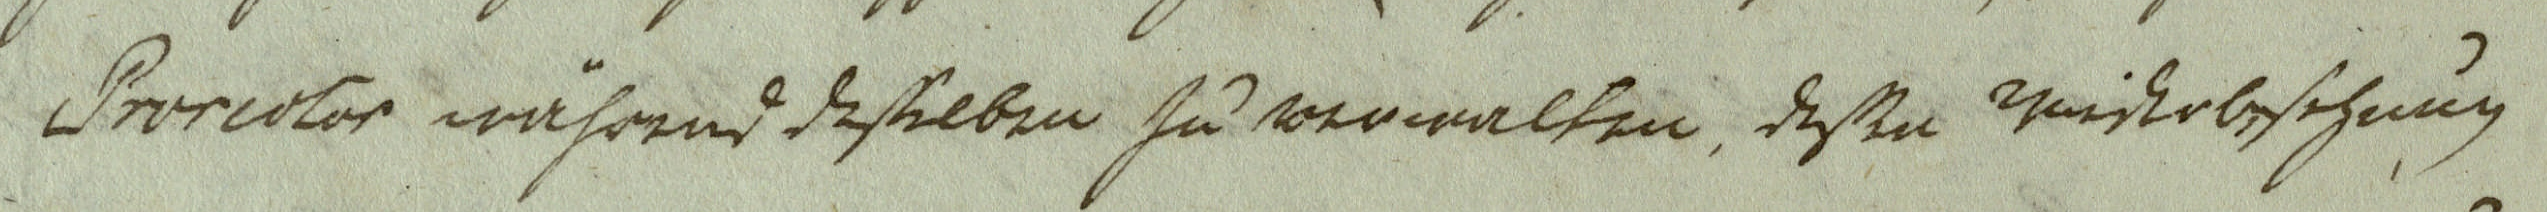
Prorector während desselben zu verwalten, dessen Wiederbesetzung
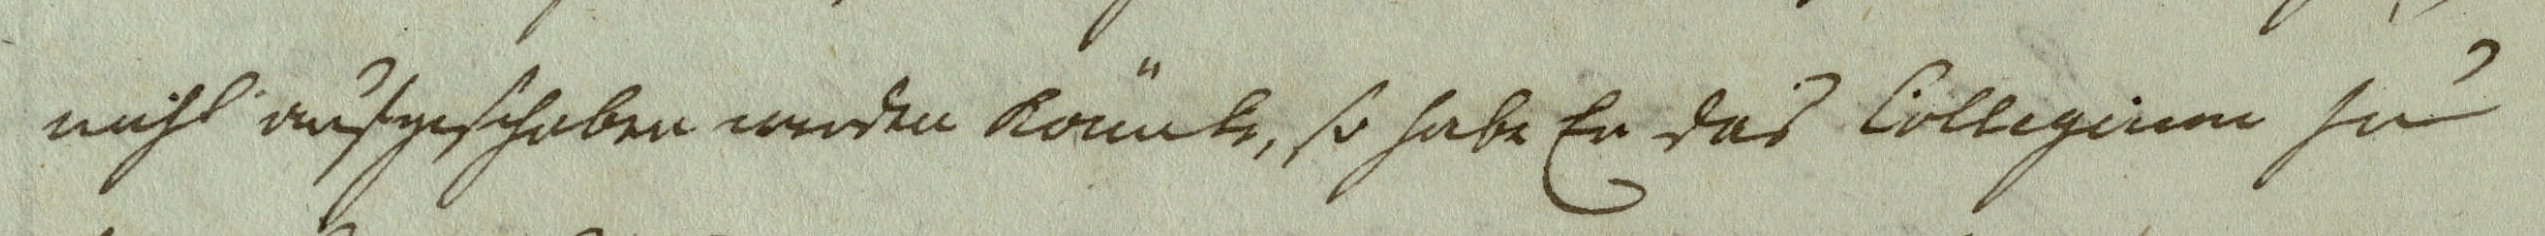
nicht aufgeschoben werden könnte, so habe Er das Collegium zu
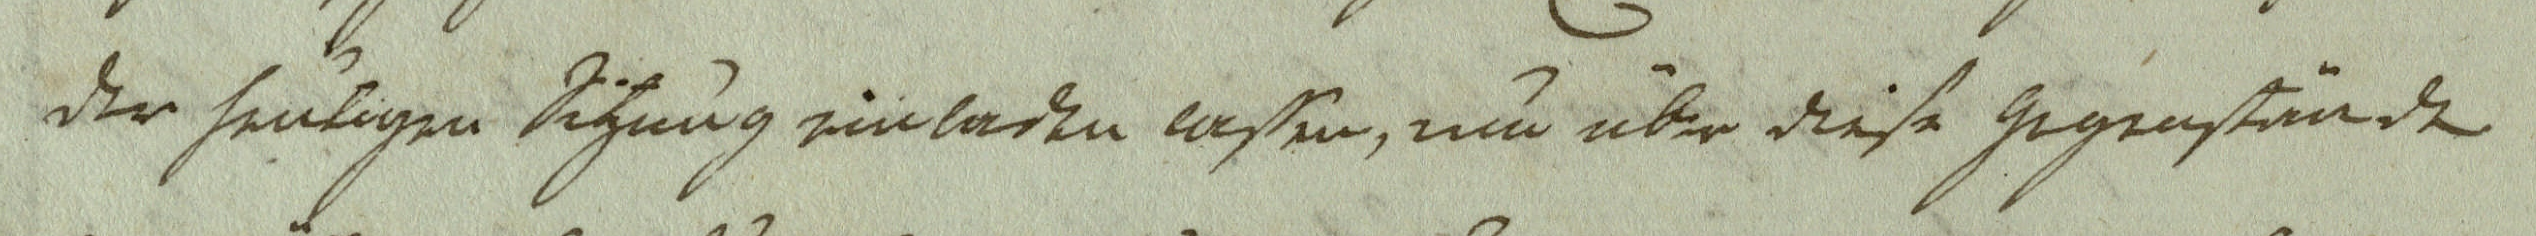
der heutigen Sitzung einladen lassen, um über diese Gegenstände
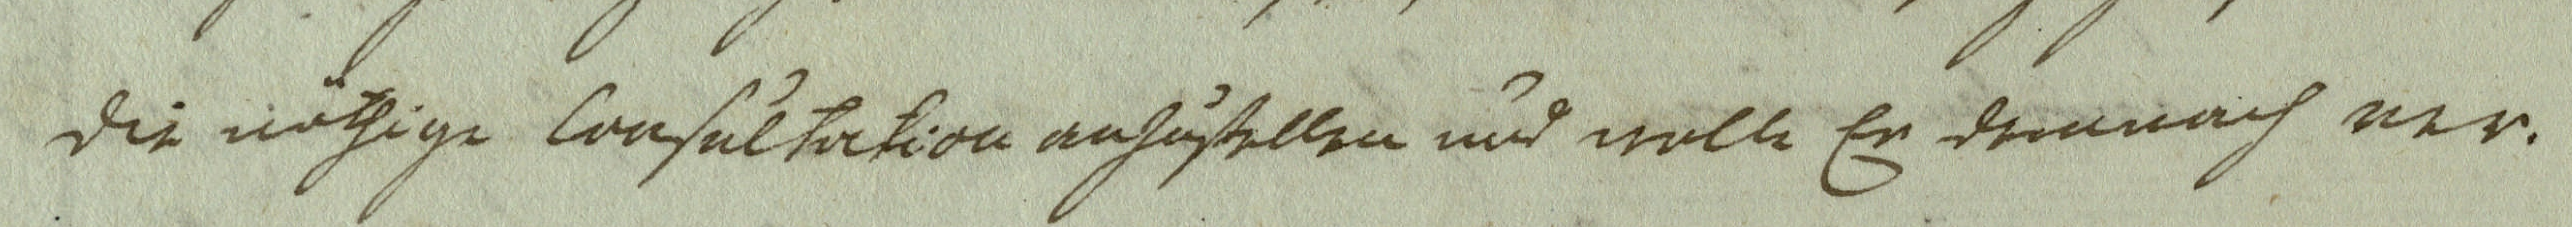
die nöthige Consultation anzustellen und wolle Er demnach ver¬
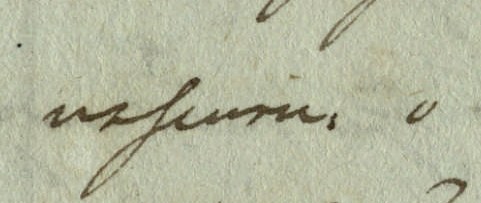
nehmen,
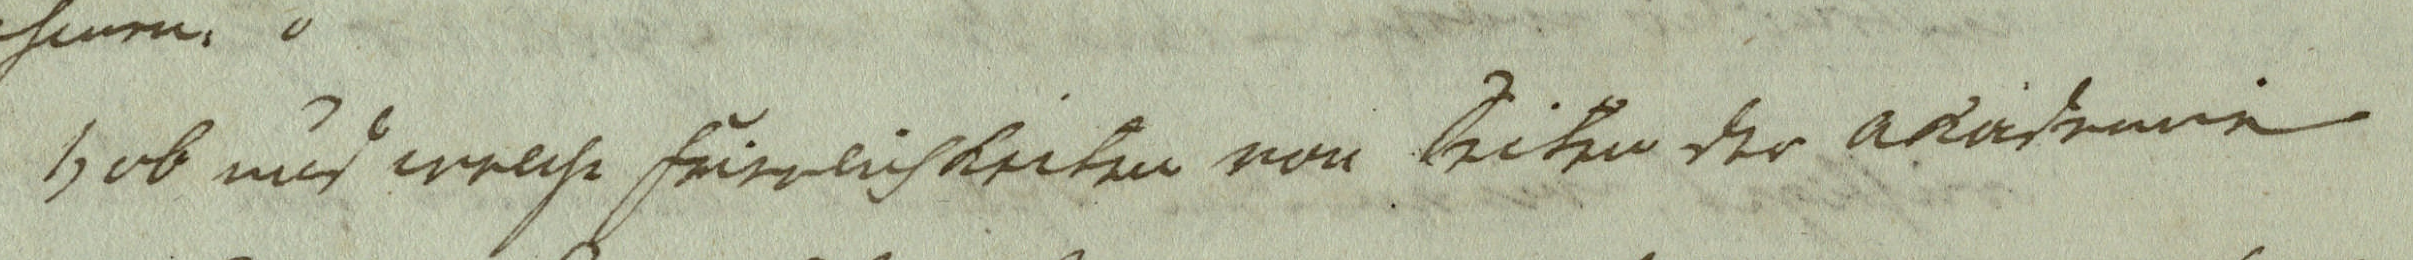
1, ob und welche Feierlichkeiten von Seiten der Akademie
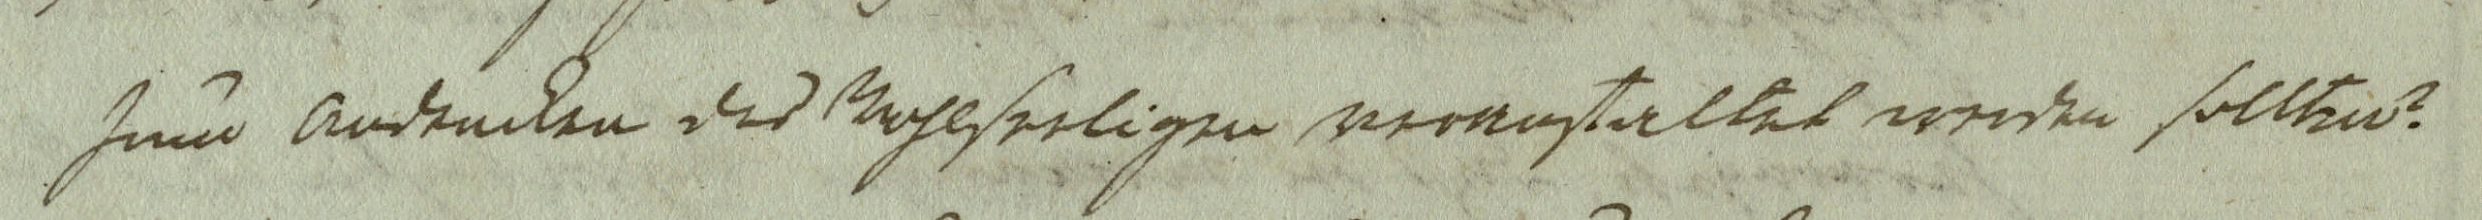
zum Andenken des Wohlseeligen veranstaltet werden sollten?
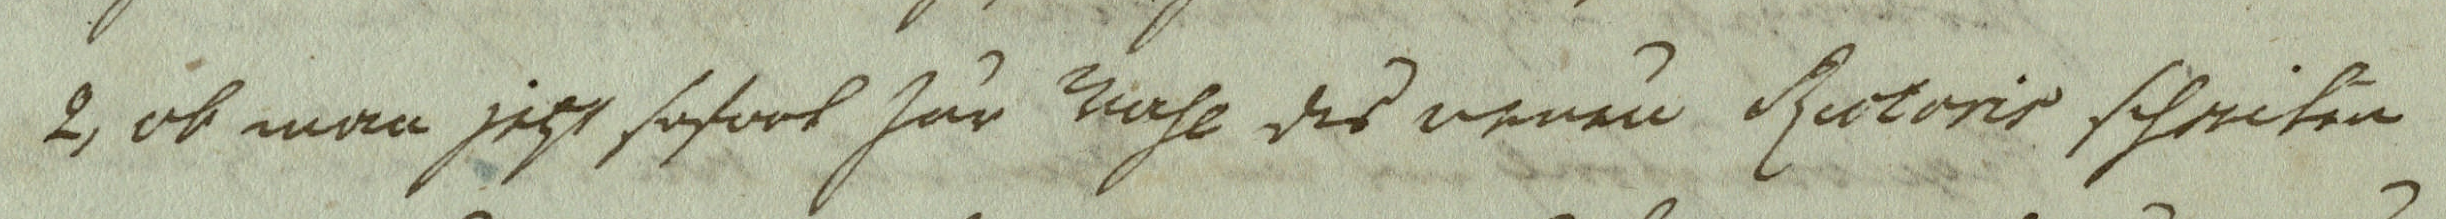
2, ob man jetzt sofort zur Wahl des neuen Rectoris schreiten
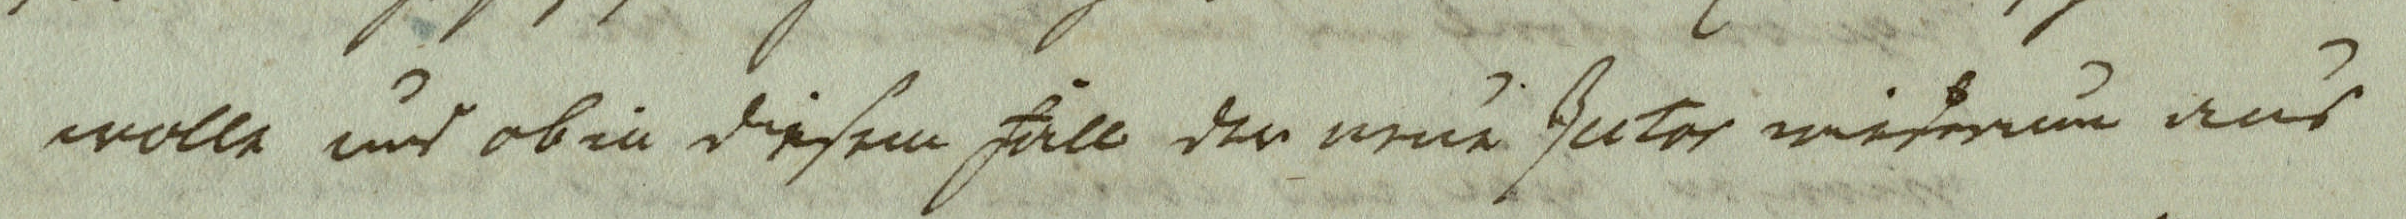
wolle und ob in diesem Fall der neue Rector wiederum aus
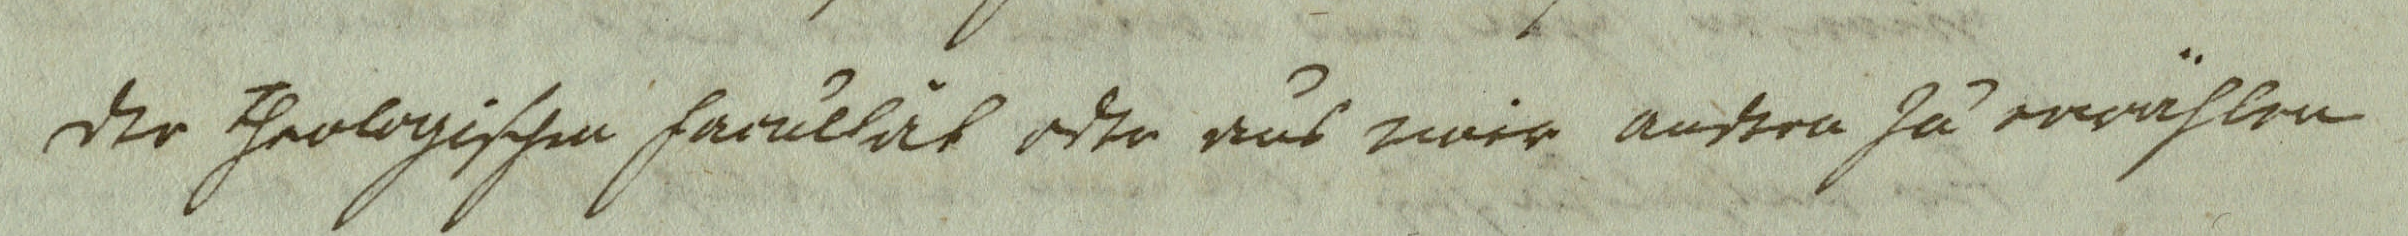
der Theologischen Facultät oder aus einer andern zu erwählen
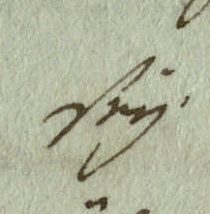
seÿ.
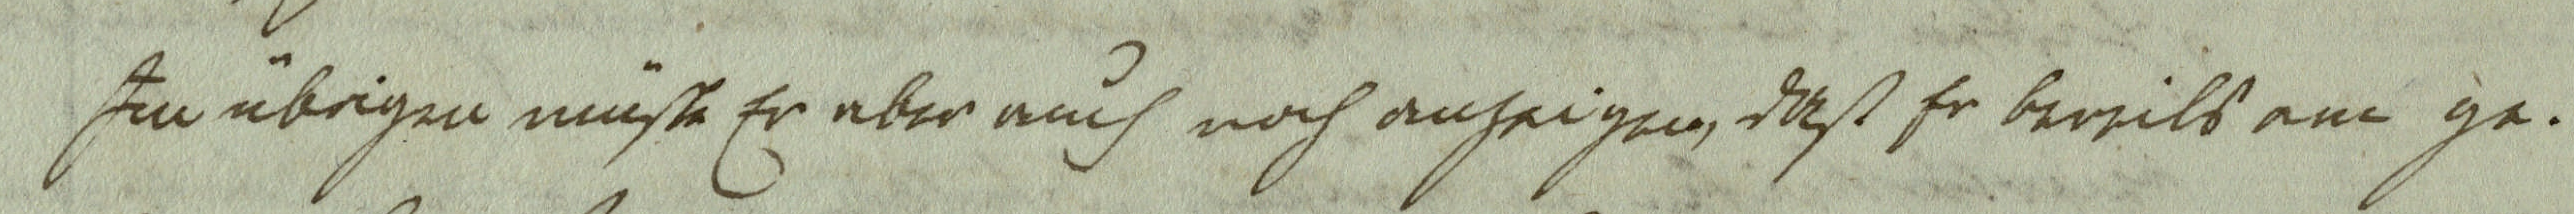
Im übrigen müsse Er aber auch noch anzeigen, daß Er bereits am ge¬
